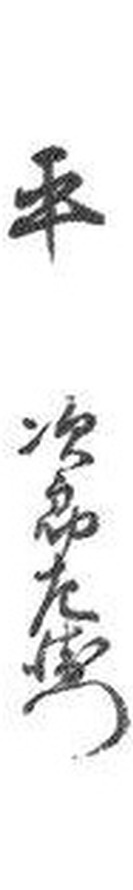平次郎左衛門
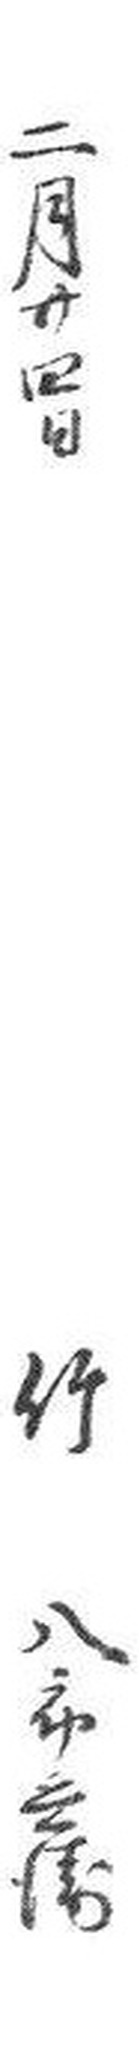二月廿四日竹八郎兵衛
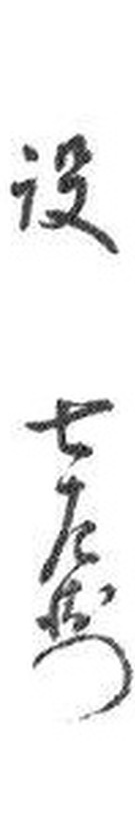役七左衛門
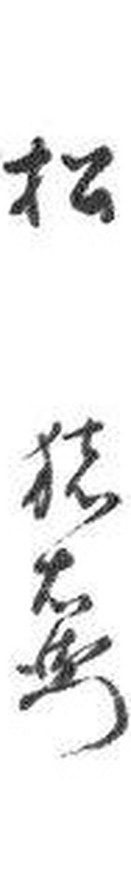松猪右衛門
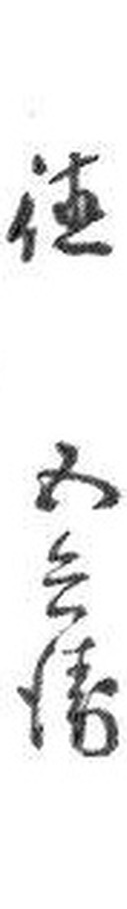徳五兵衛
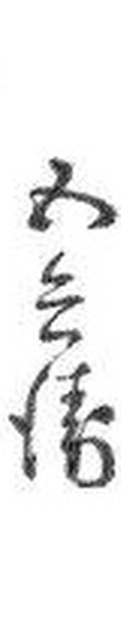徳五兵衛
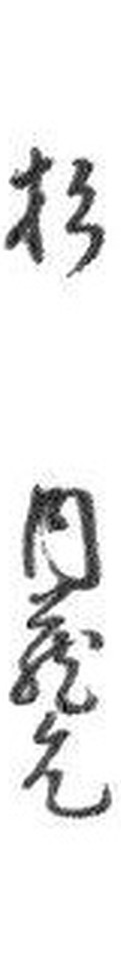杉内蔵允
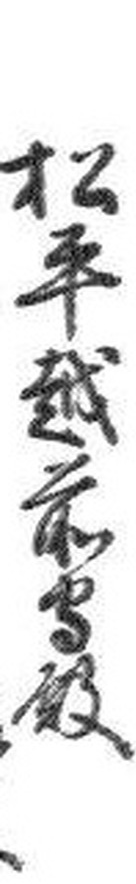松平越前守殿
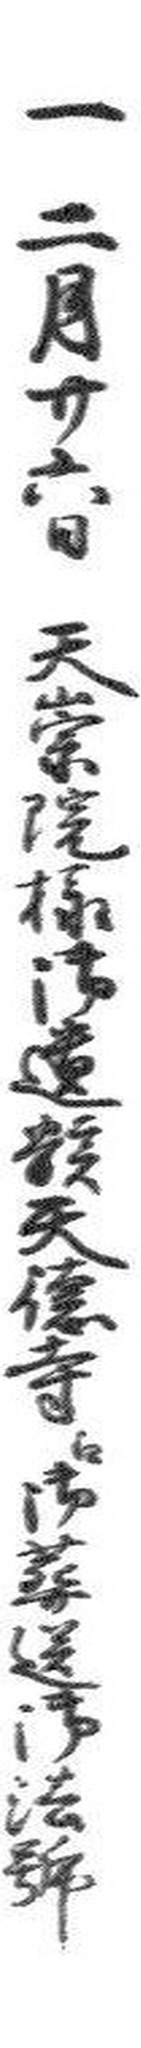一二月廿六日天崇院様御遺骸天徳寺江御葬送御法号
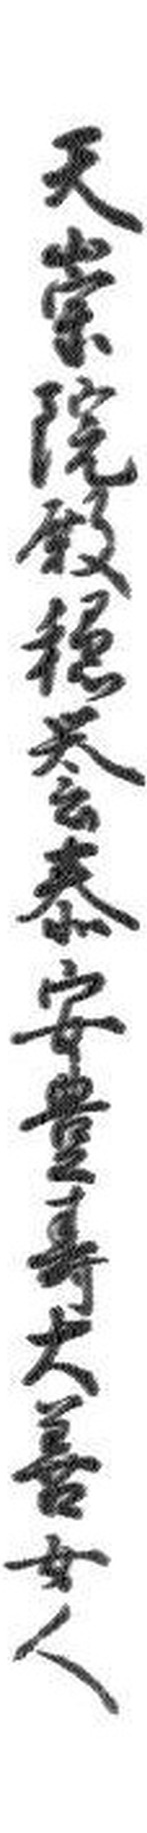天崇院殿穏誉泰安豊寿大善女人
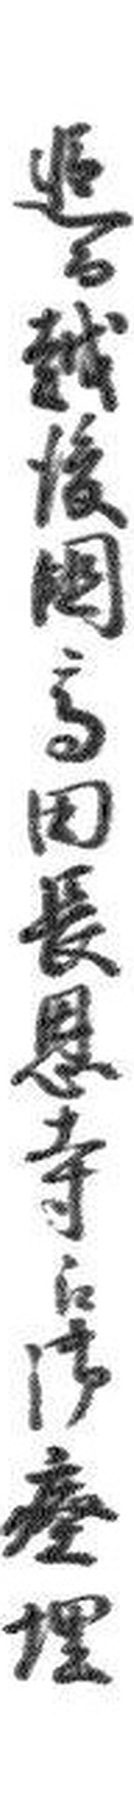追而越後国高田長恩寺江御瘞埋
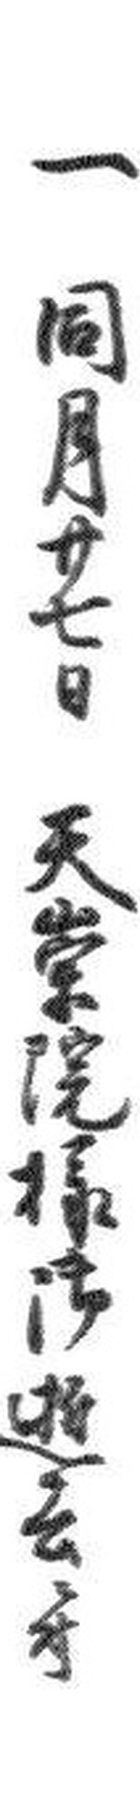一同月廿七日天崇院様御逝去ニ付
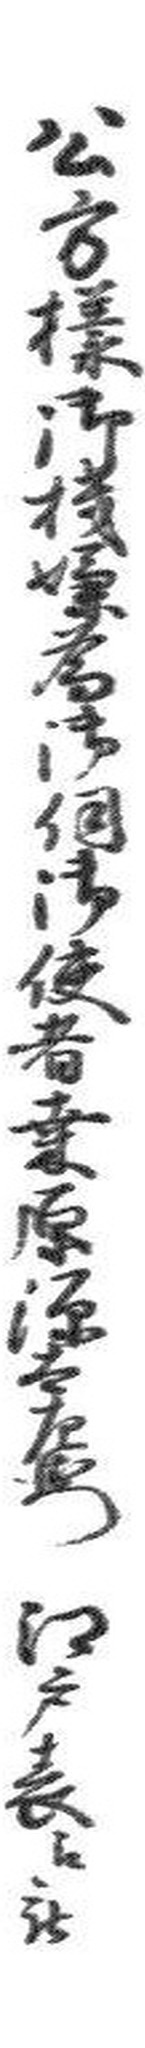公方様御機嫌為御伺御使者桑原源太左衛門江戸表江被
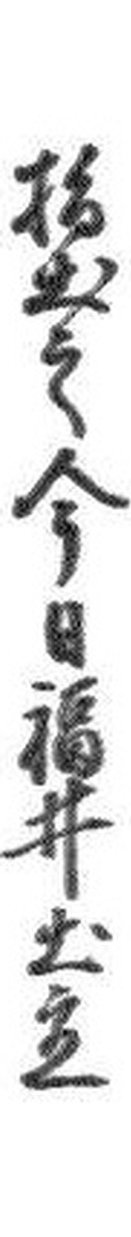指出之今日福井出立
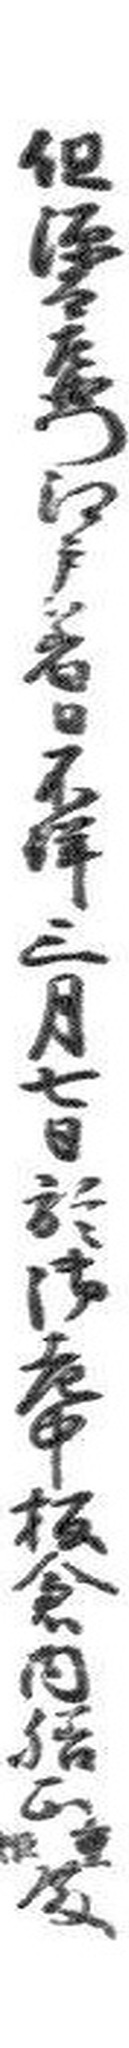但源太左衛門江戸着日不詳三月七日於御老中板倉内膳正重矩殿
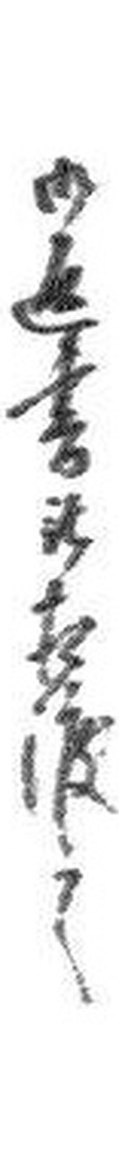御返書被相渡之
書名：家譜 八 光通公 従寛文十年到同十二年
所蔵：福井県文書館 Fukui Prefectural Archives
